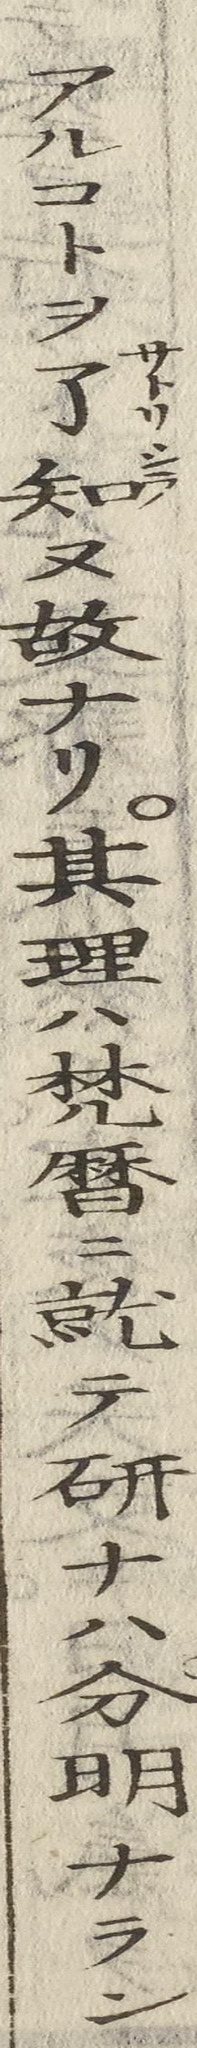アルコトヲ了知ヌ故ナリ。其理ハ梵暦ニ就テ研ナハ。分明ナラン
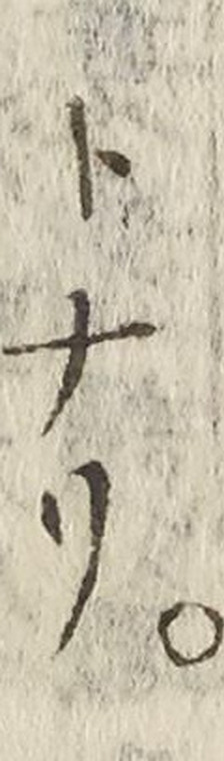トナリ。
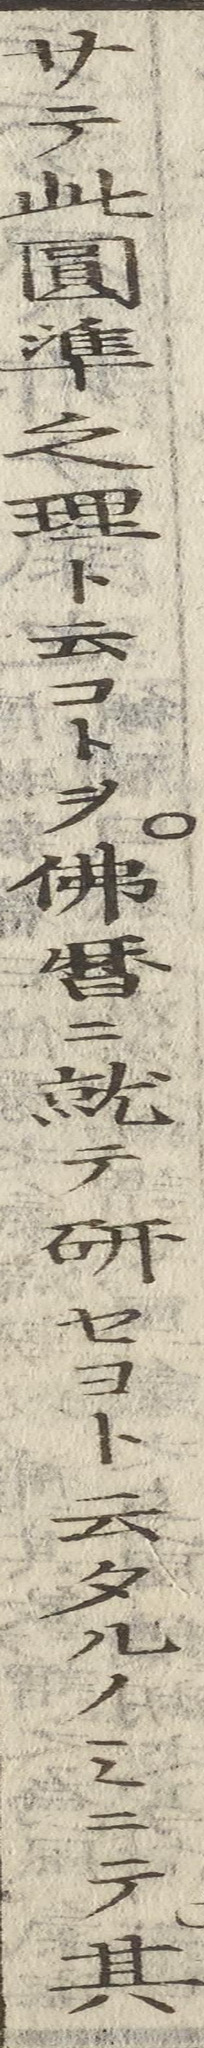サテ此円準之理ト云コトヲ。仏暦ニ就テ研セヨト云タルノミニテ。其
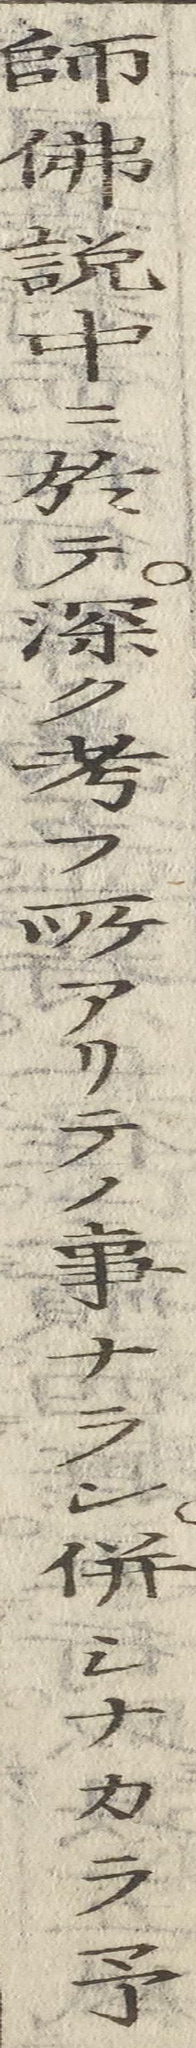師仏説中ニ於テ。深ク考フ所アリテノ事ナラン。併シナカラ予
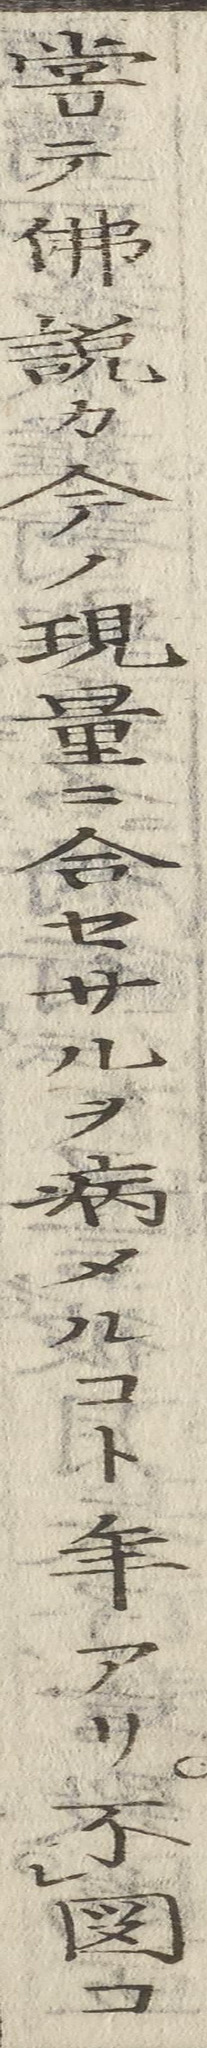嘗テ仏説カ今ノ現量ニ合セサルヲ病メルコト年アリ。不図コ
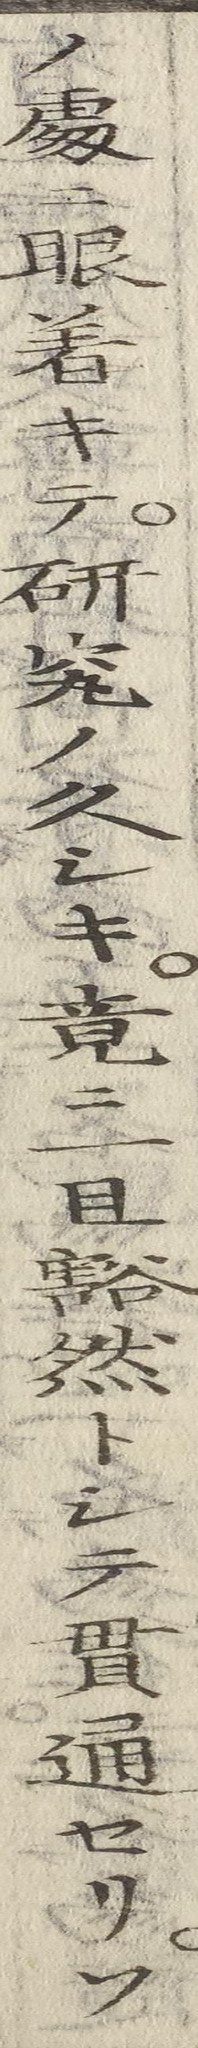ノ処ニ眼着キテ。研究ノ久シキ。竟ニ一旦豁然トシテ貫通セリ。ソ

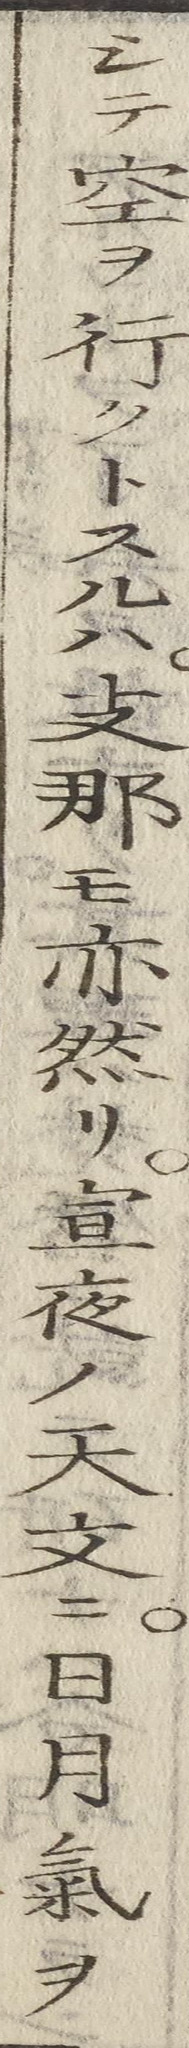シテ空ヲ行クトスルハ。支那モ亦然リ。宣夜ノ天文ニ。日月気ヲ
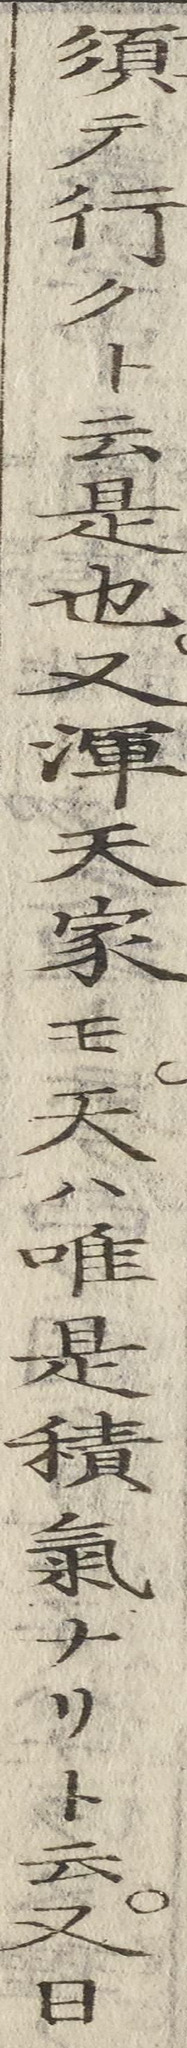須テ行クト云是也。又渾天家モ。天ハ唯是積気ナリト云。又日
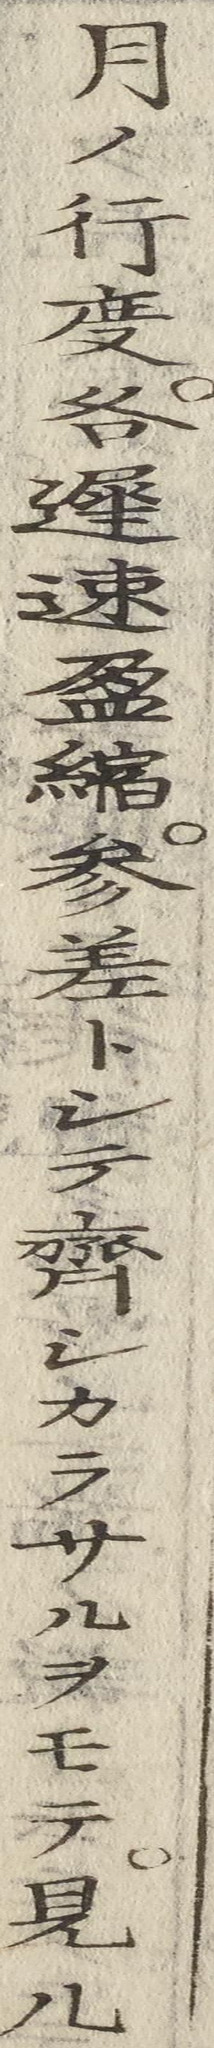月ノ行度。各遅速盈縮。参差トシテ齊シカラサルヲモテ。見ル
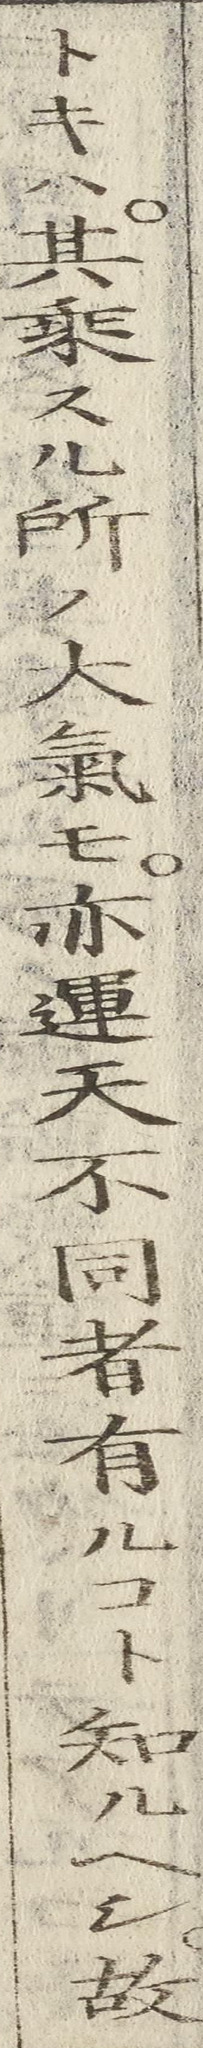トキハ。其乗スル所ノ大気モ。亦運天不同者有ルコト知ルヘシ。故
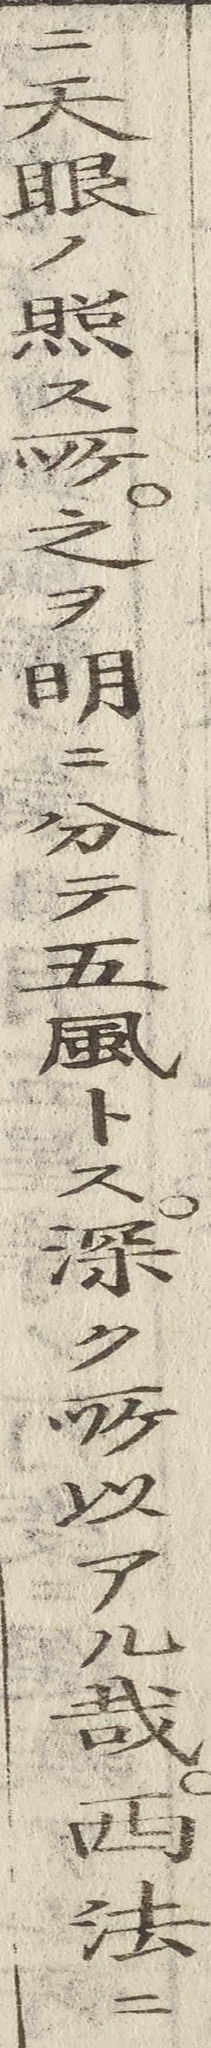ニ天眼ノ照ス所。之ヲ明ニ分テ五風トス。深ク所以アル哉。西法ニ
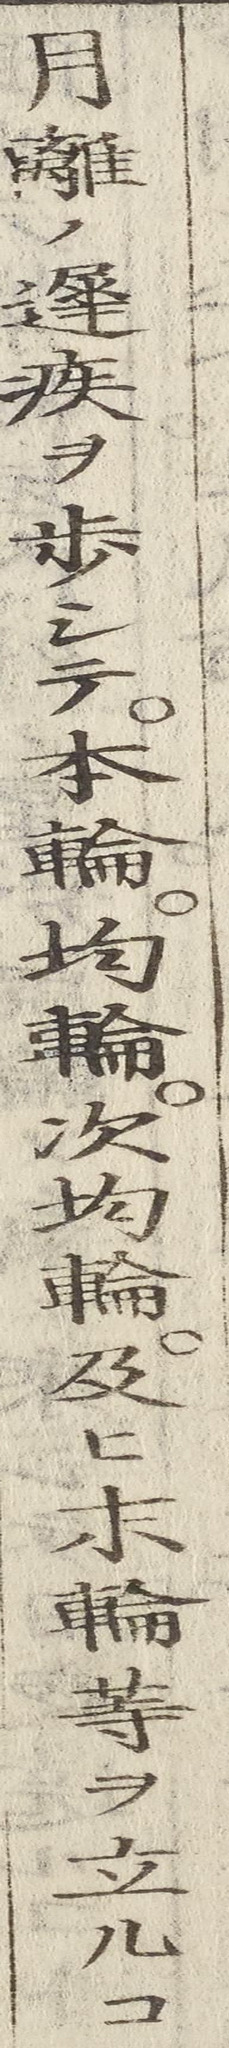月離ノ遅疾ヲ歩シテ。本輪。均輪。次均輪。及ヒ末輪等ヲ立ルコ
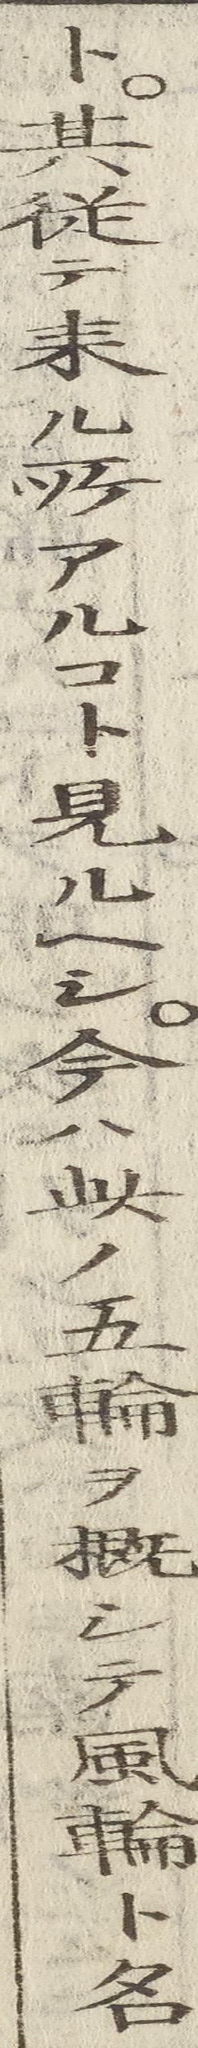ト。其従テ来ル所アルコト見ルヘシ。今ハ此ノ五輪ヲ概シテ風輪ト名
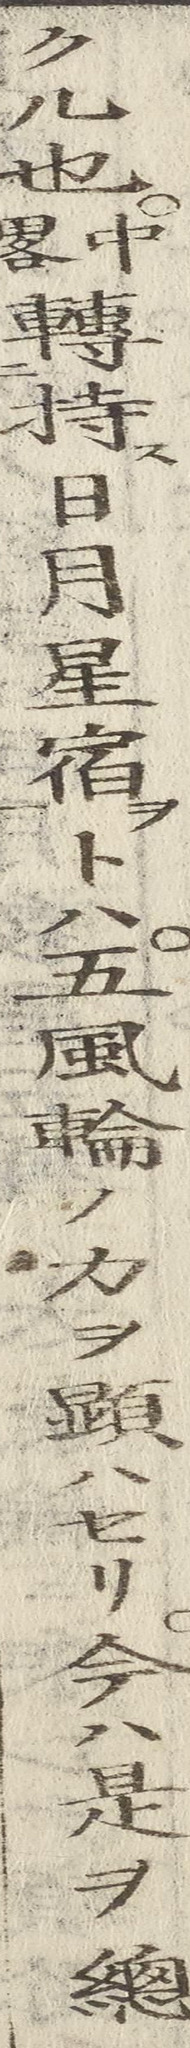クル也。中略転持日月星宿。五風輪ノ力ヲ顕ハセリ。今ハ是ヲ総
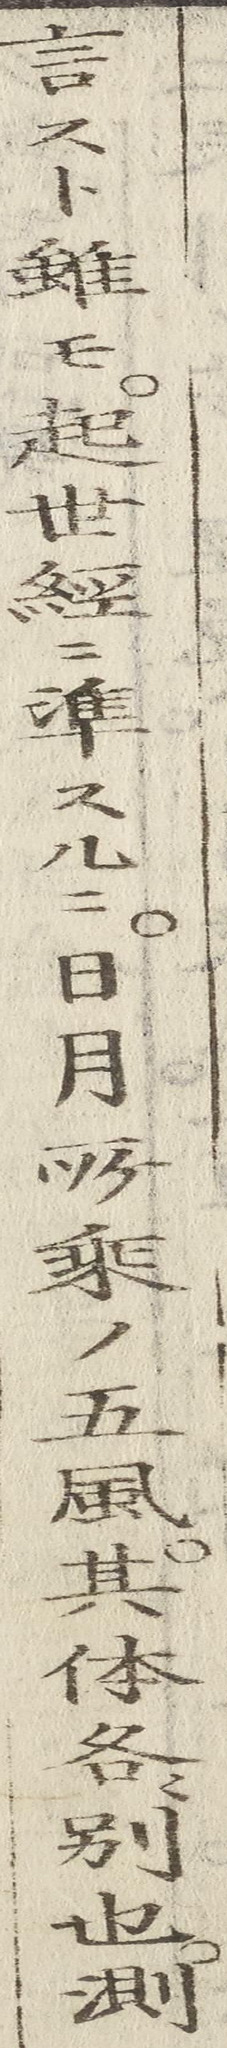言スト雖モ。起世経ニ準スルニ。日月所乗ノ五風。其体各〳〵別也。測
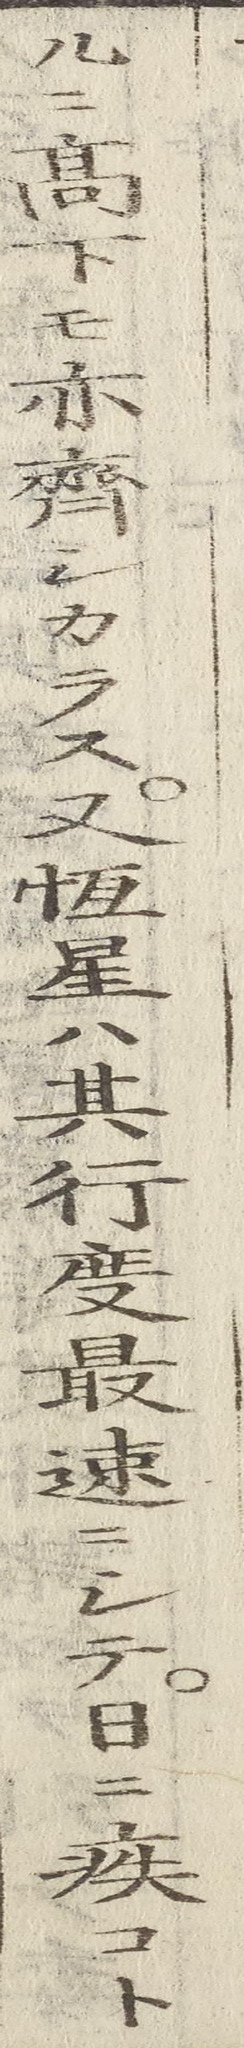ルニ高下モ亦齊シカラス。又恆星ハ其行度最速ニシテ。日ニ疾コト
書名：護法新論　上
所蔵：東京大学地震研究所図書室 Earthquake Research Institute Library, The University of Tokyo, JAPAN
